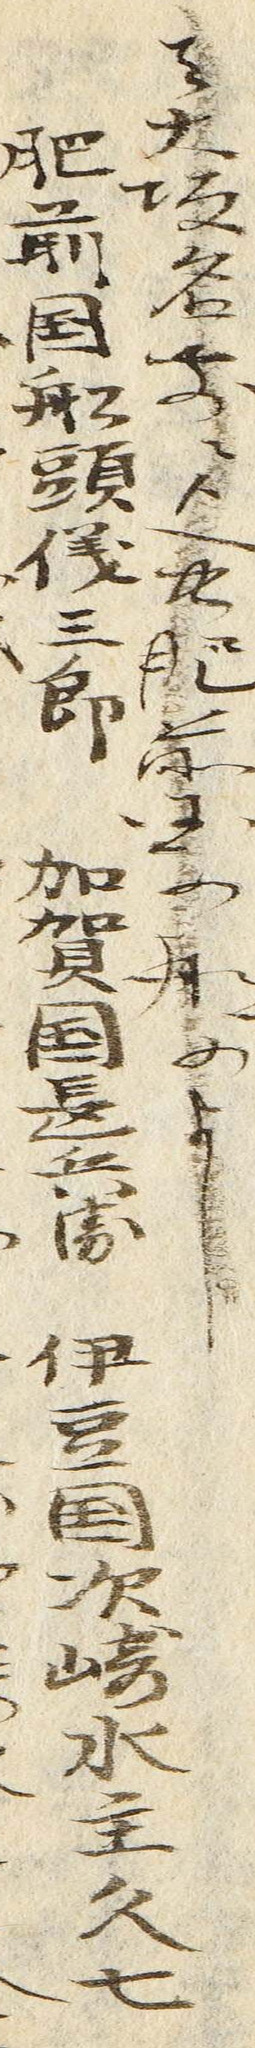肥前国船頭儀三郎加賀国長兵衛伊豆国次崎水主久七
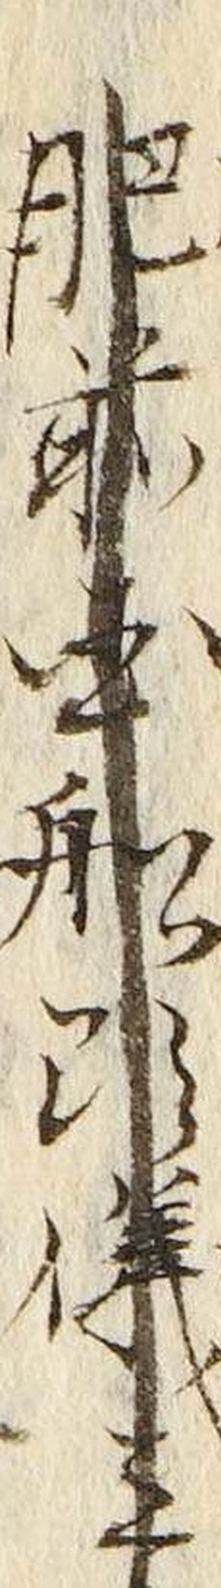肥前国五兵衛
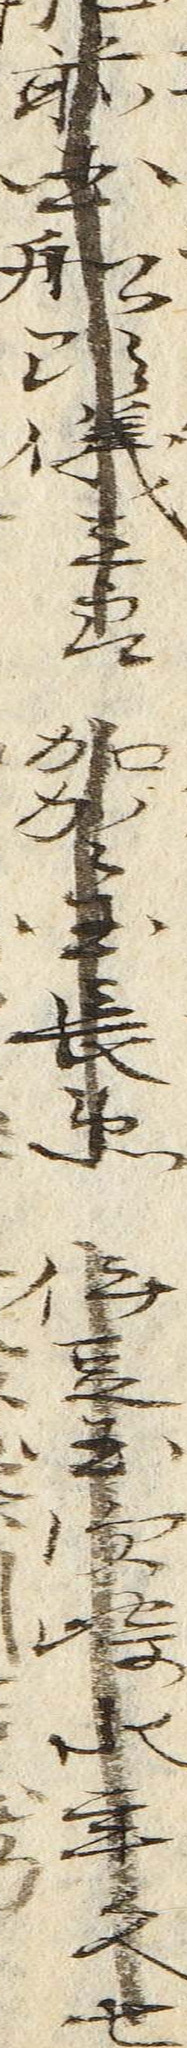肥前国船頭儀三郎加賀国長兵衛伊豆国次崎水主久七
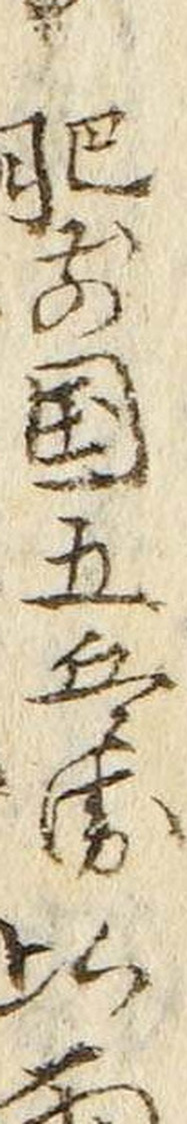肥前国五兵衛

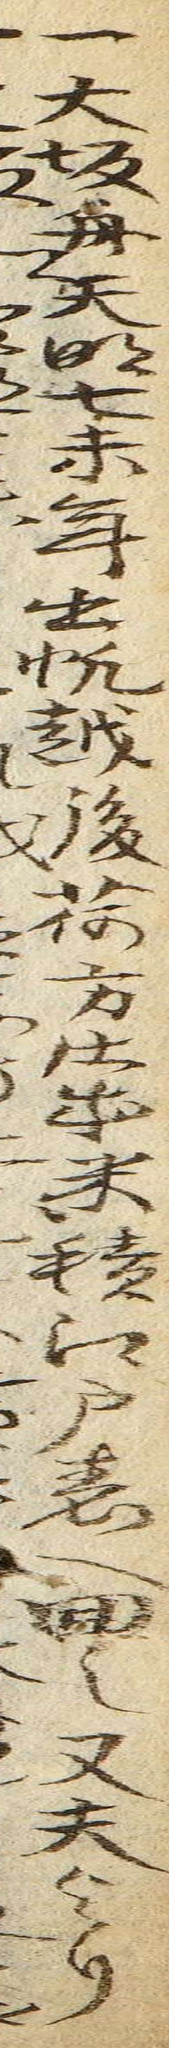一大坂舟天明七未年出帆越後荷方仕成米積江戸表へ回し又夫より
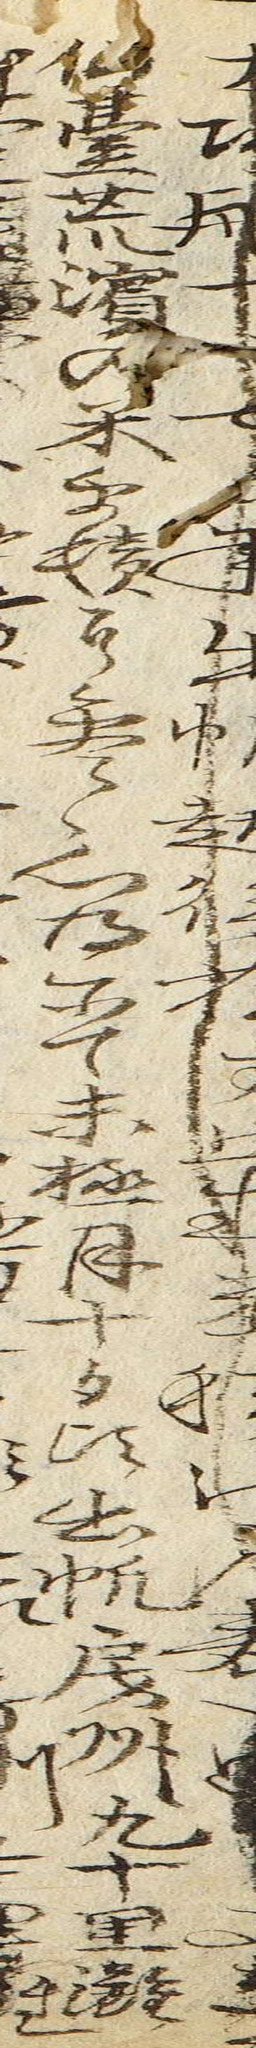仙台荒浜の米を積に参候心得にて未極月十日頃出帆房州九十里灘
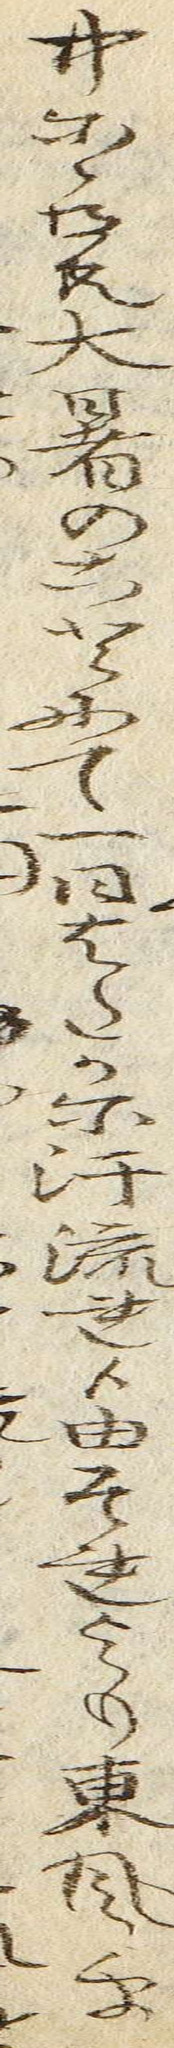中に候得共大暑のことにて一日はたかに汗流れ候由それより東風を
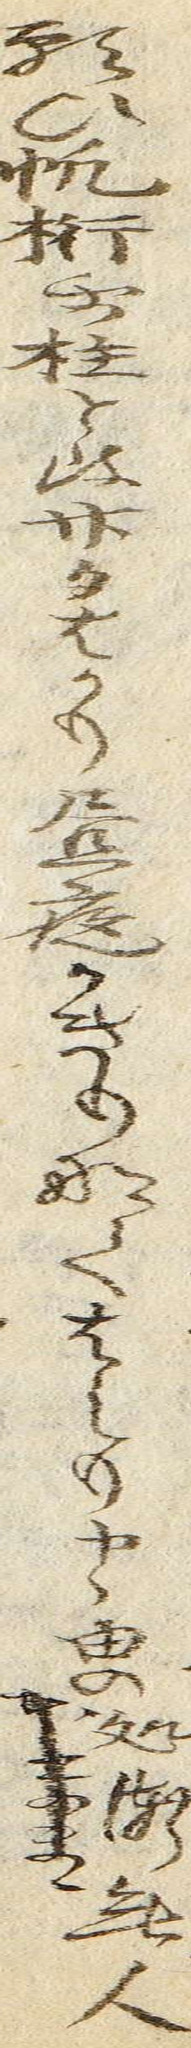願ひ帆桁を柱と致廿日はかり昼夜かきりなくはしり申候由の処漸無人
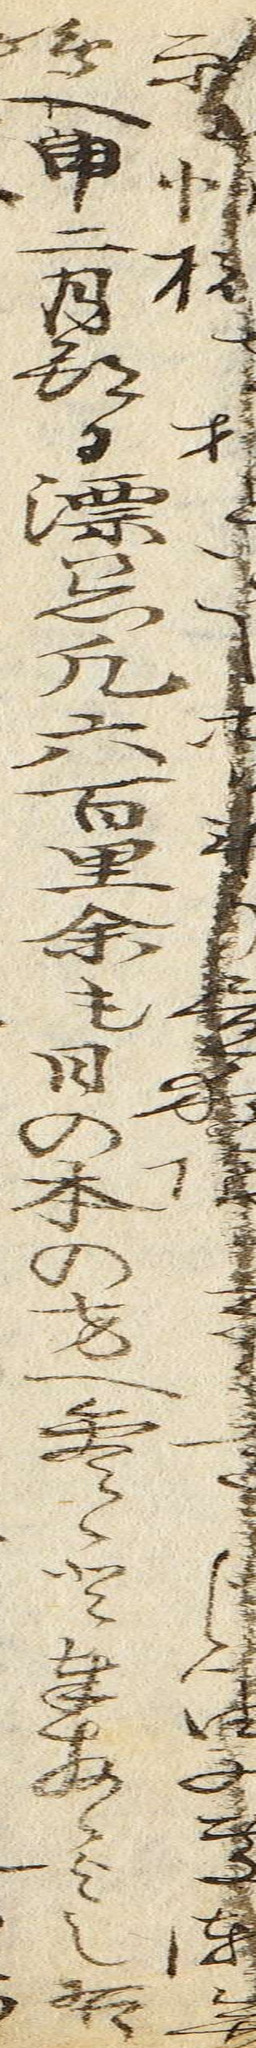島へ申二月朔日漂着凡六百里余も日の本の方へ参候と奉存候よし右
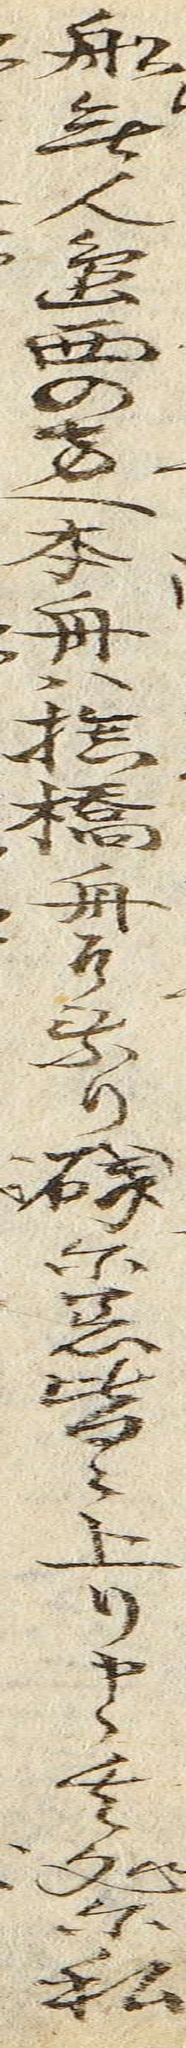船無人島西の方へ本舟ハ捨橋舟に乗り磯に着皆々上り申候其処に私
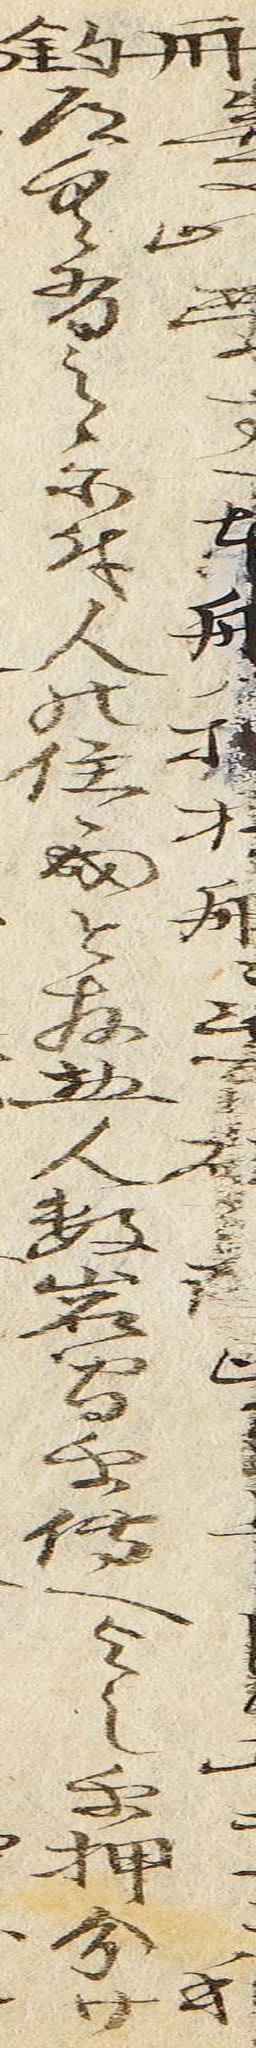釣道具有之候に付人の住候成と存惣人数岩間を伝へよしを押分け
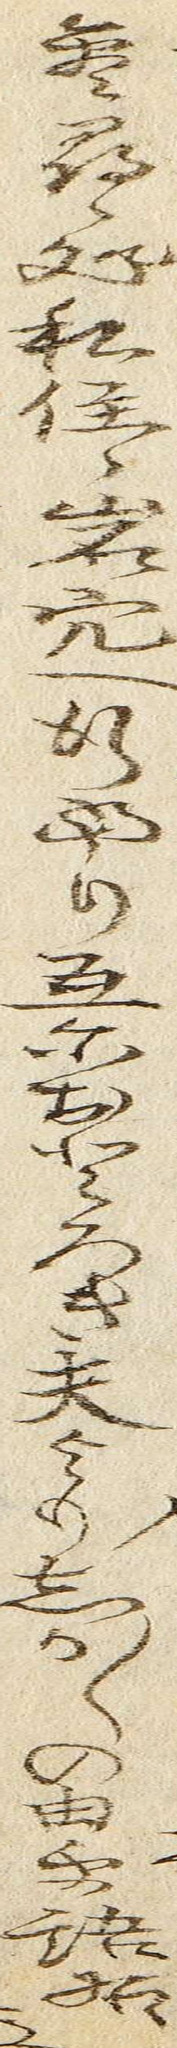参尋候処私住候岩穴へ行当り互におとろき夫よりしか〳〵の由を語右
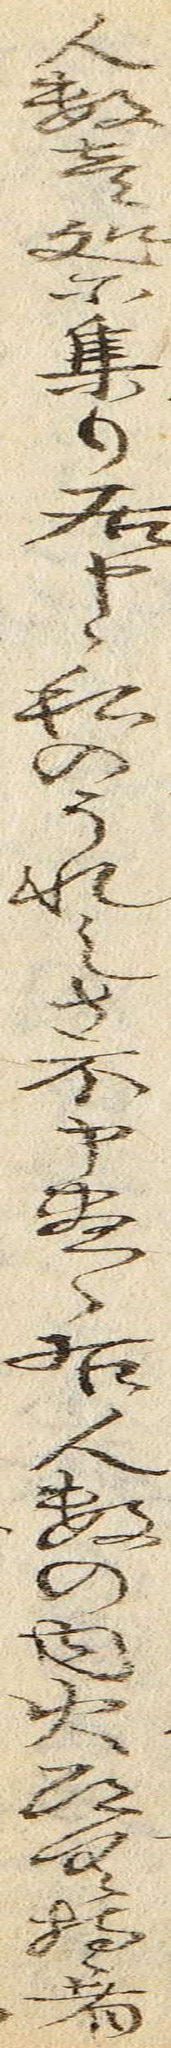人数壱処に集り居申候私のうれしさ不申尽候右人数の内火道具持候者
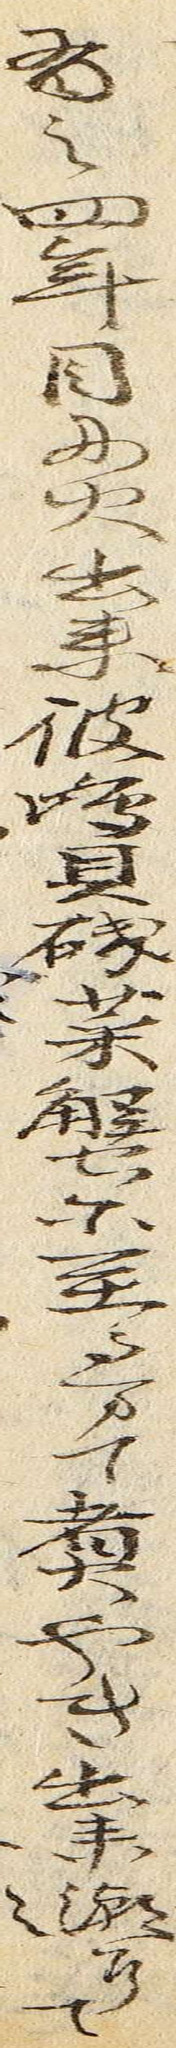有之四年目に火出来彼嶋貝磯菜蟹に至るまて煮やき出来漸にて
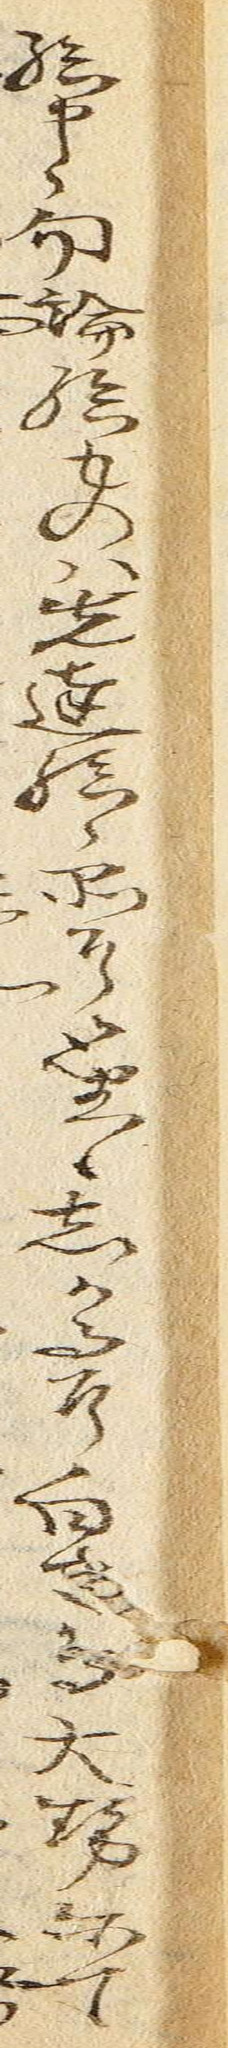給申候勿論給ものハ先達給候品に御座候しかるに白き鳥大勢にて
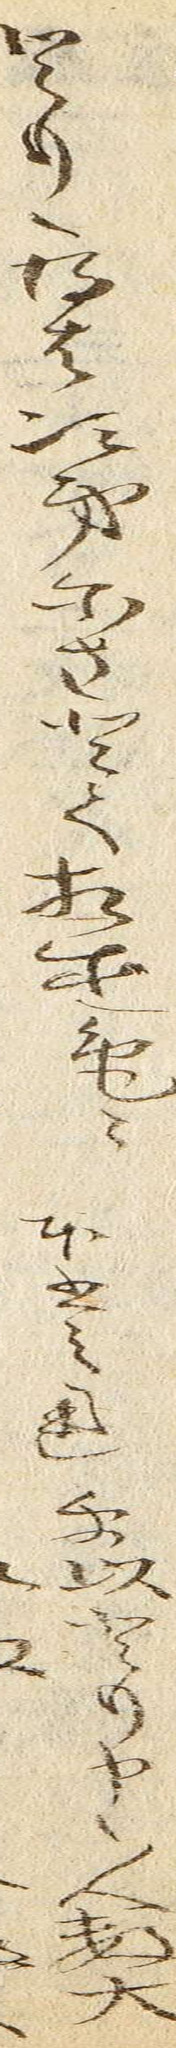とり候得者次第にさとく相成色々ちやくきを以とり申候人数大
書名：無人島漂流書付
